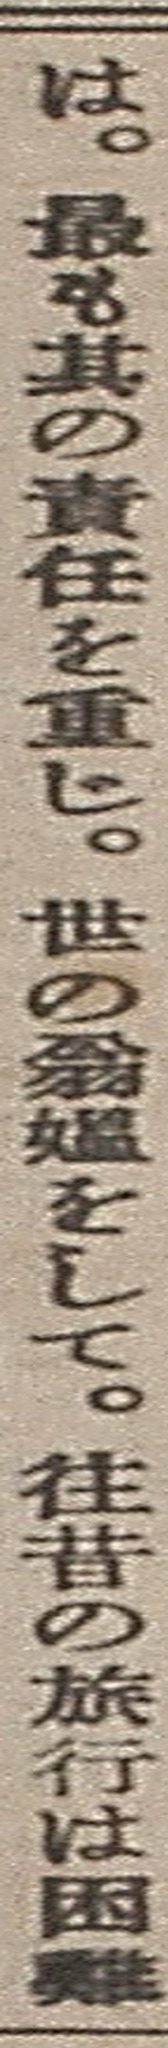は。最も其の責任を重じ。世の翁媼をして。往昔の旅行は困難
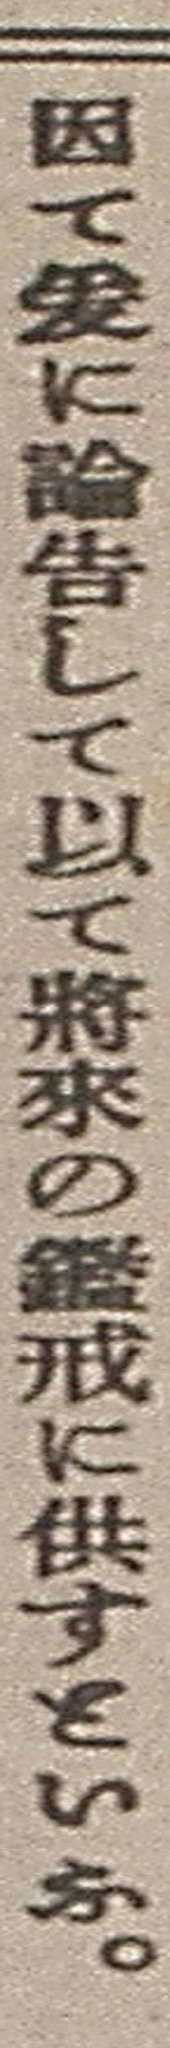因て爰に論告して以て将来の鑑戒に供すといふ。
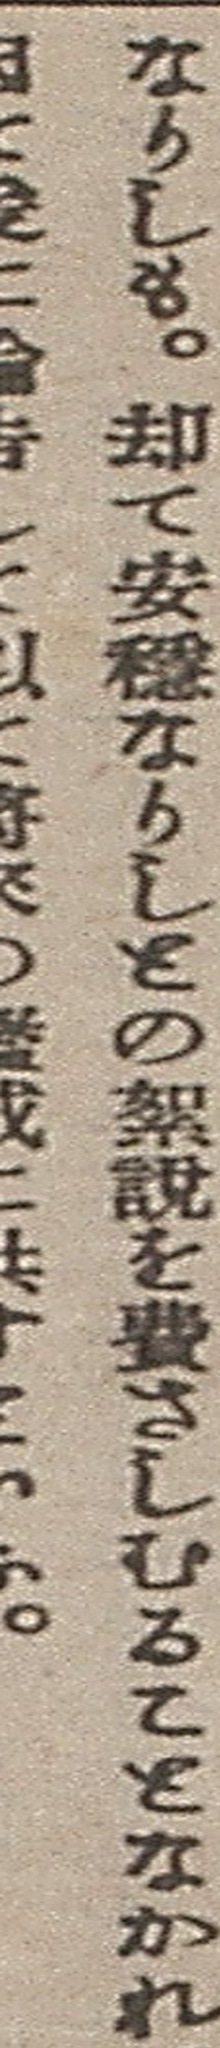なりしも。却て安穏なりしとの絮説を費さしむることなかれ。
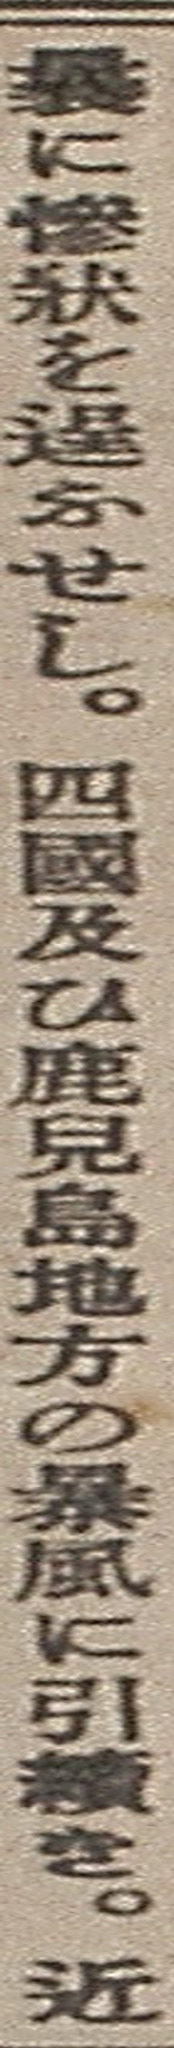曩に惨状を逞ふせし。四国及ひ鹿児島地方の暴風に引続き。近
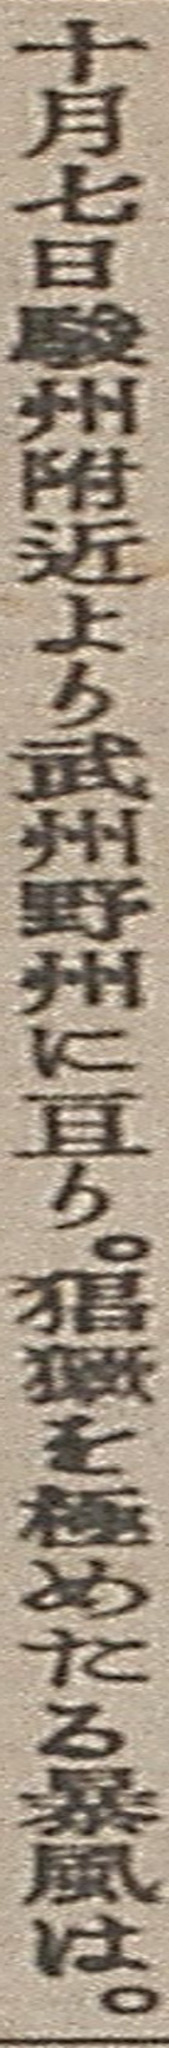十月七日駿州附近より武州野州に亘り。猖獗を極めたる暴風は。
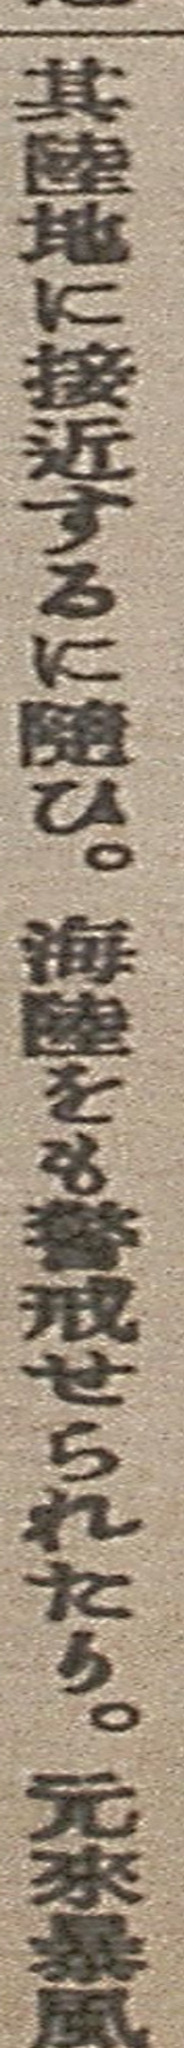其陸地に接近するに随ひ。海陸をも警戒せられたり。元来暴風
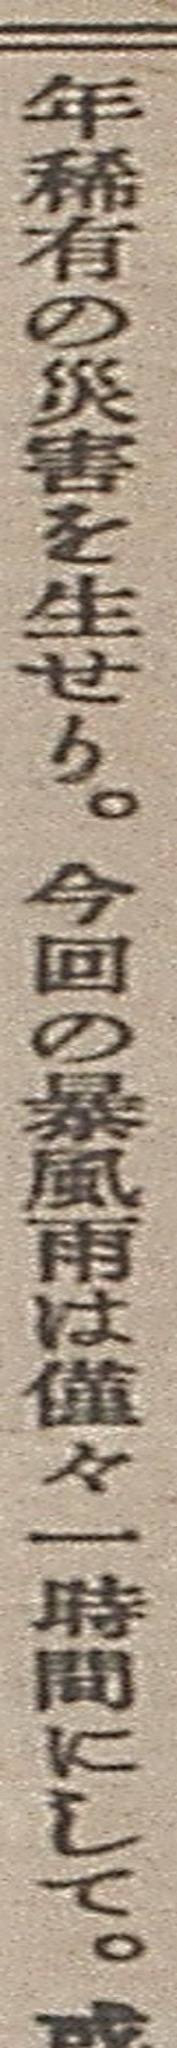年稀有の災害を生せり。今回の暴風雨は僅々一時間にして。或
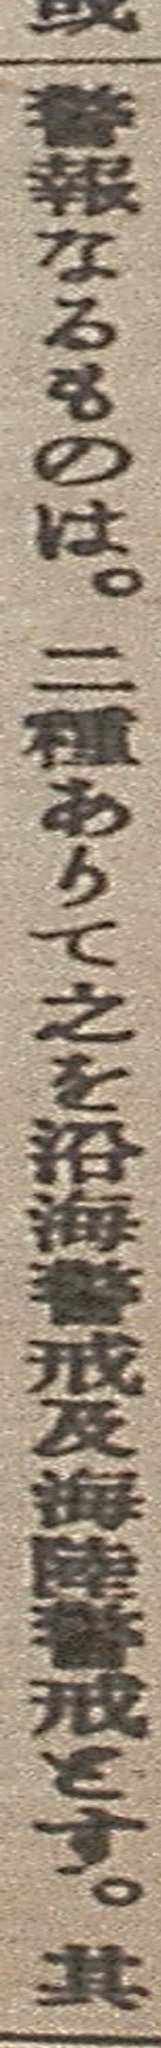警報なるものは。二種ありて之を沿海警報及海陸警戒とす。其
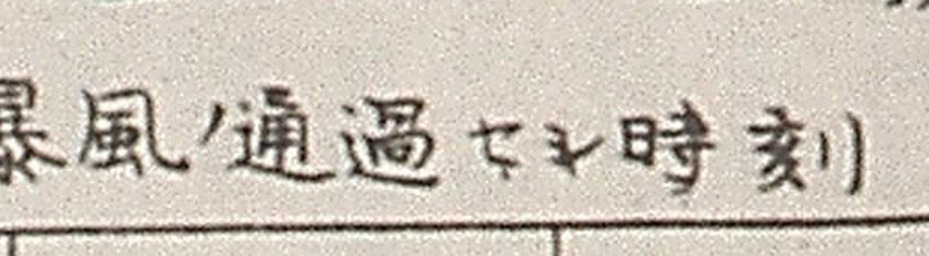暴風ノ通過セシ時刻

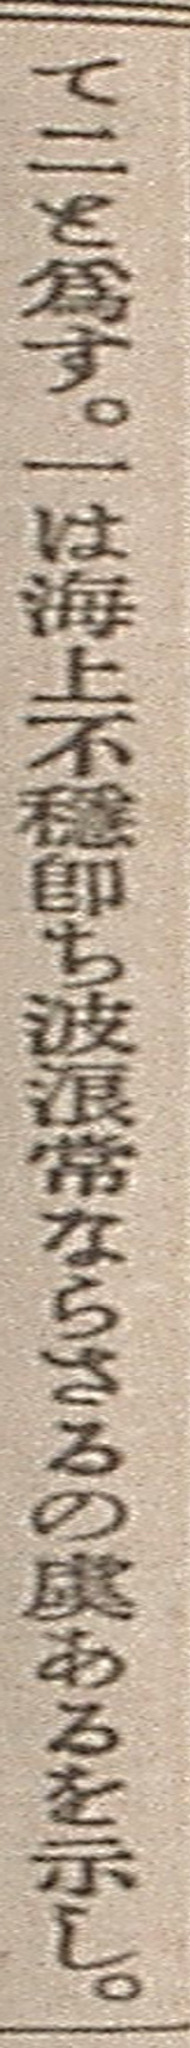てニと為す。一は海上不穏即ち波浪常ならさるの虞あるを示し。
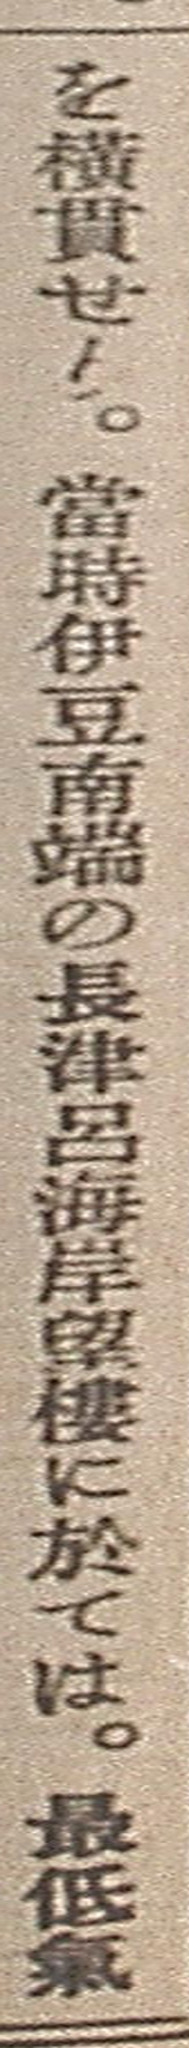を横貫せり。当時伊豆南端の長津呂海岸望楼に於ては。最低気
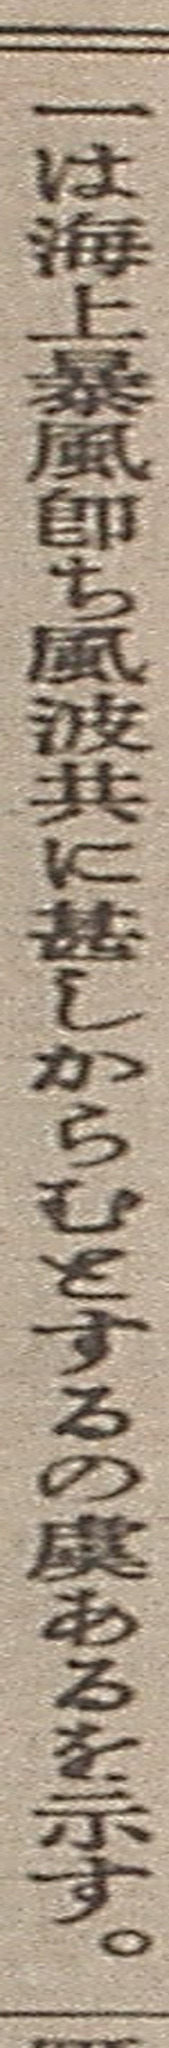一は海上暴風即ち風波共に甚しからむとするの虞あるを示す。
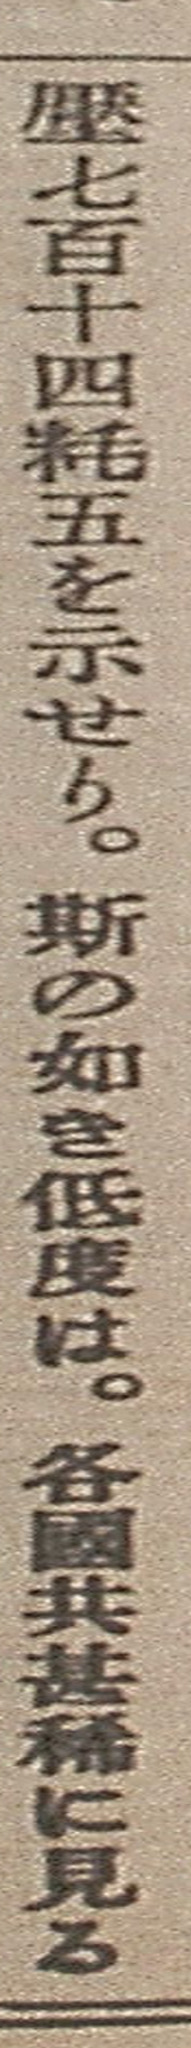圧七百十四粍五を示せり。斯の如き低度は。各国共甚稀に見る
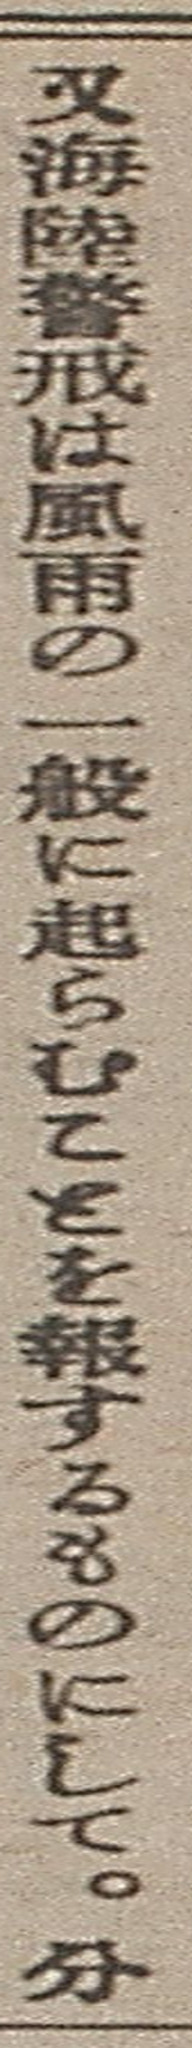又海陸警戒は風雨の一般に起らむことを報するものにして。分
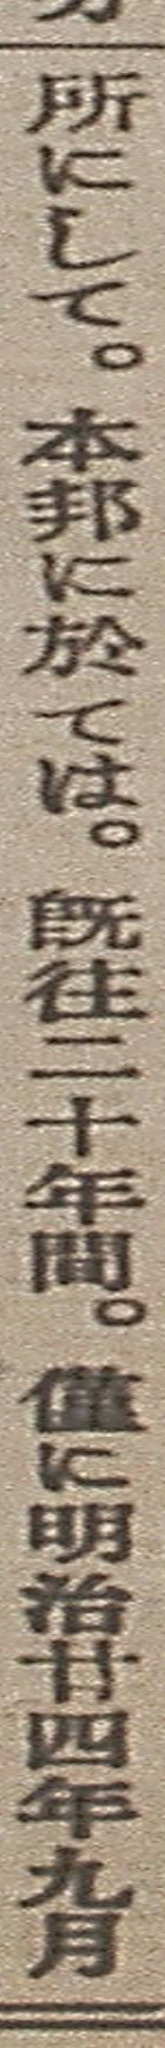所にして。本邦に於ては。既往二十年間。僅に明治廿四年九月
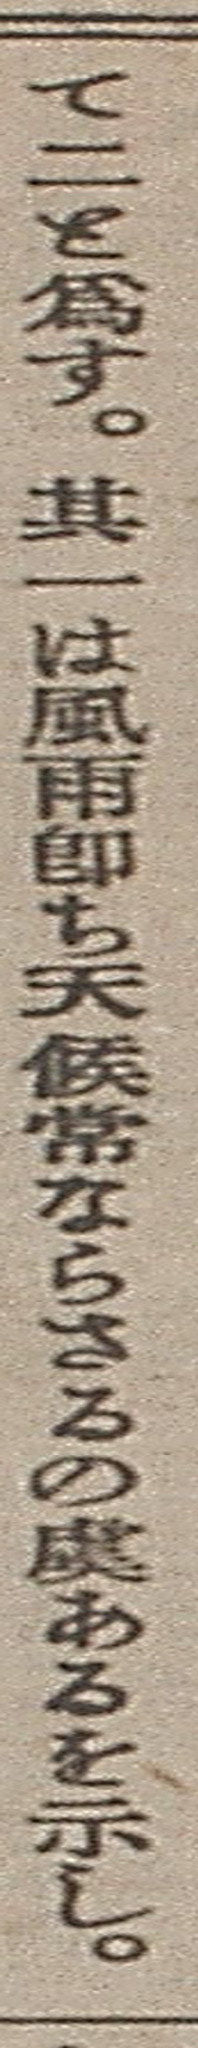てニと為す。其一は風雨即ち天候常ならさるの虞あるを示し。
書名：風俗畫報臨時増刊第百九十九號　明治三十二年十月各地災害圖會（前編之續）
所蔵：東京大学地震研究所図書室 Earthquake Research Institute Library, The University of Tokyo, JAPAN
